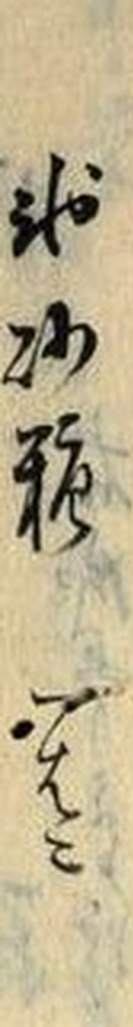氷砂糖一はこ
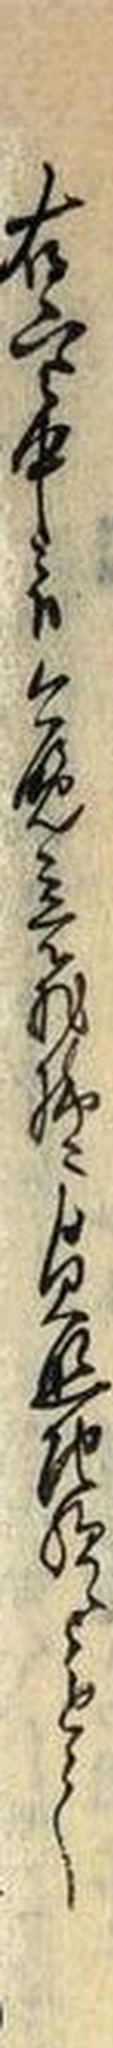右寒中ニ付今晩立飛脚ニ貞照院様へ被進之
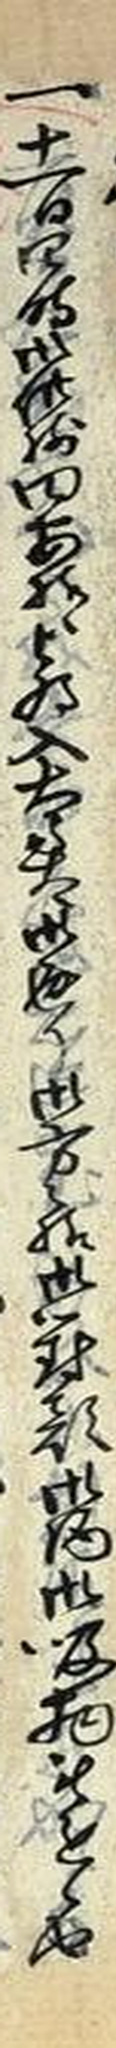一十一日四時御供揃田安様へ被為入大奥へ御通り御方々様御対顔御酒御吸物被進候由
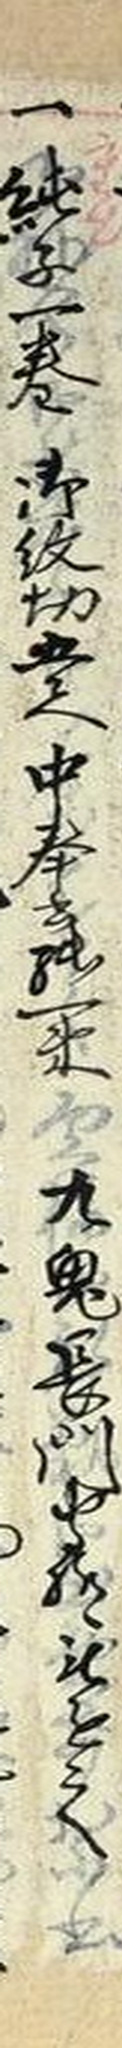一純子一巻御紋切五尺中奉書紙一束九鬼長門守様へ被進之
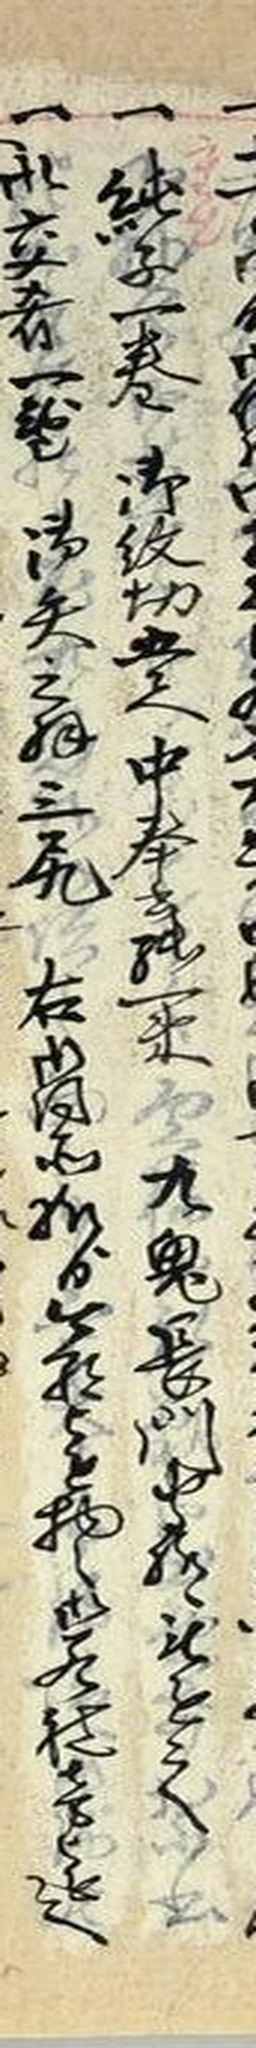一御交肴一台御矢之羽三尻右御同所様ゟ今朝被進物之御答礼旁被進之
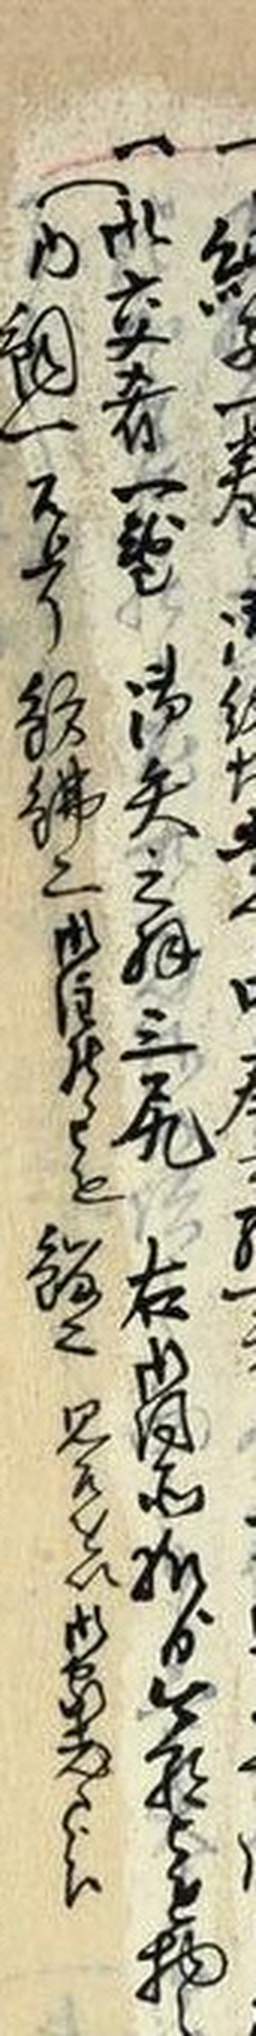内鯛一召上り魴鮄二御住居へ被進鯔二思召を以御家老へ被下
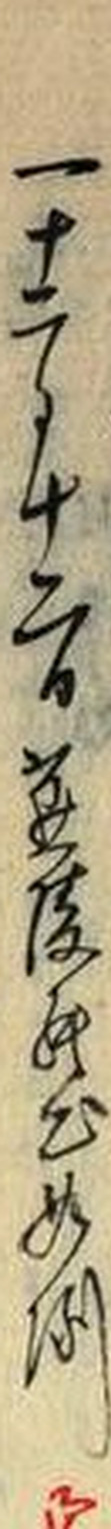一十二月十二日燕陵罷出如例
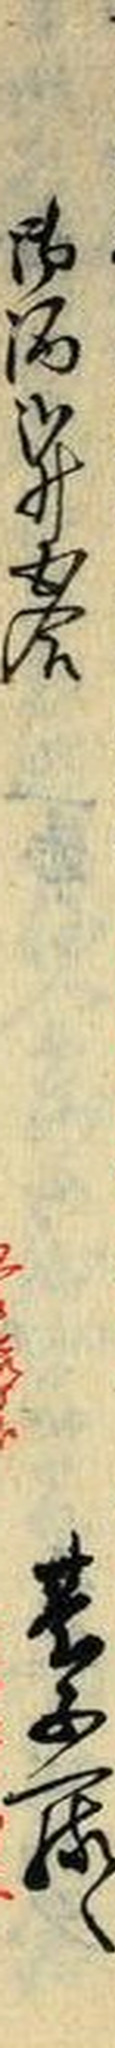御酒弐升五合台子一統へ
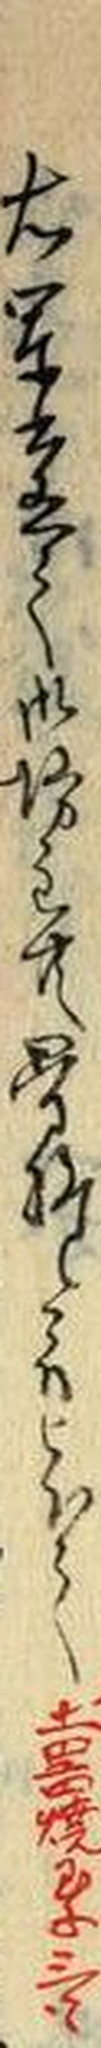右軍書有之御坊主共骨折候ニ付被下之
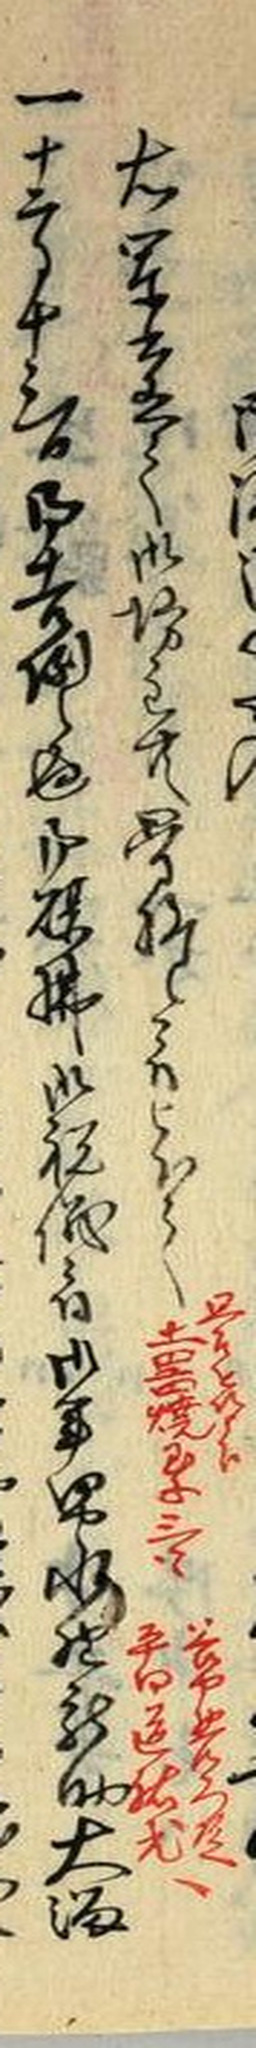一十二月十三日御吉例之通御煤払御祝儀ニ付御年男水野新助大溜
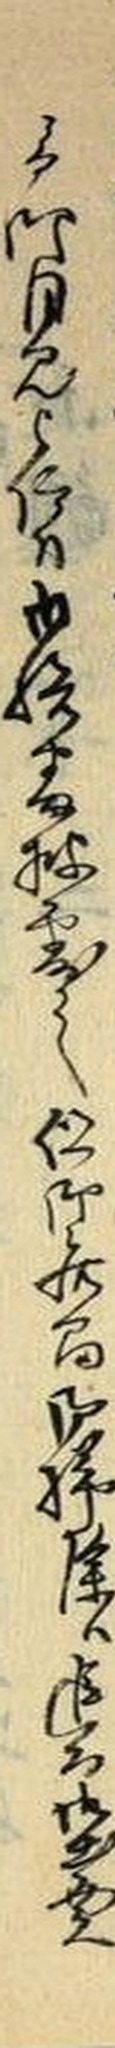ニ而御目見被仰付御膳番披露之但御居間御掃除ハ追而御出殿
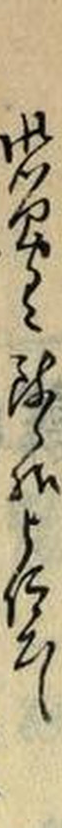御留守ニ致候様被仰付候
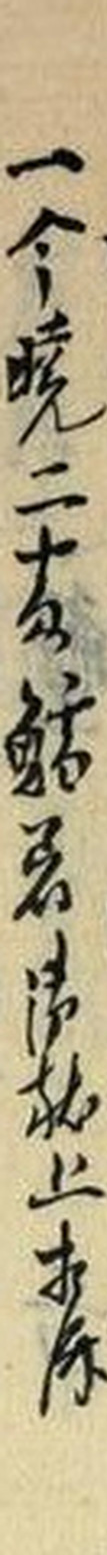一今暁二番鱈着御献上相済
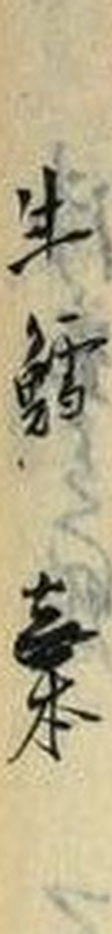生鱈壱本
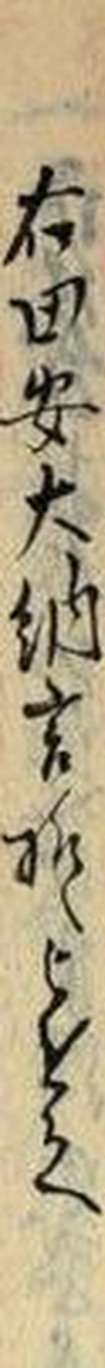右田安大納言様へ被進之
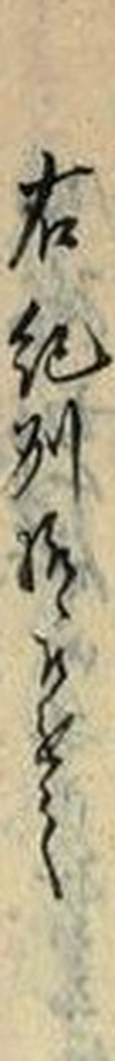右紀州様へ被進之
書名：少傅日録抄（斉承付側向頭取日記、在府）
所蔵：福井県文書館 Fukui Prefectural Archives
